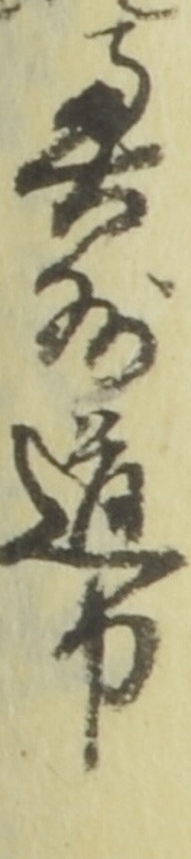奥州道中
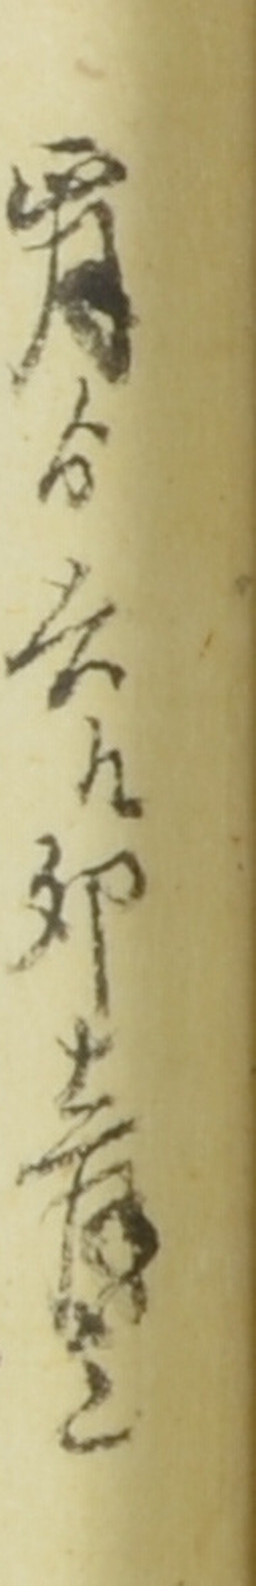正月ゟ去ル十二月迄
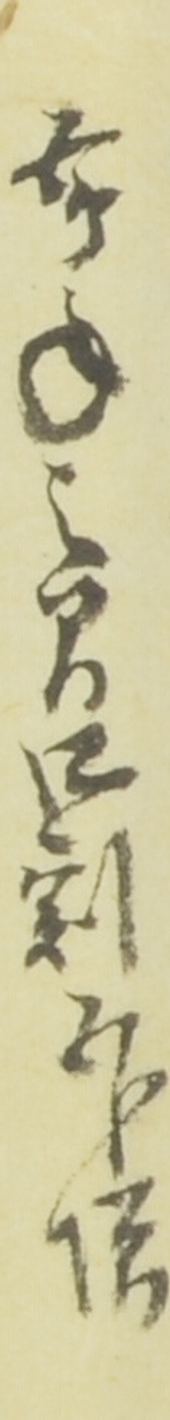五ヶ年之間四割五分増
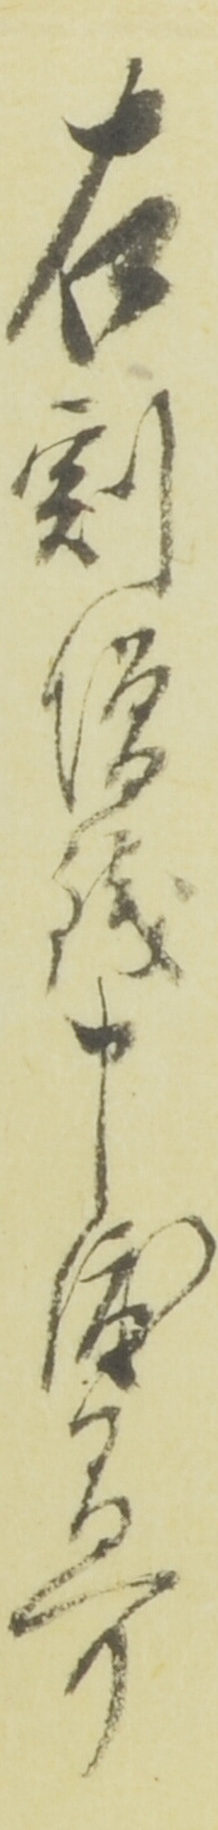右割増銭申渡間可
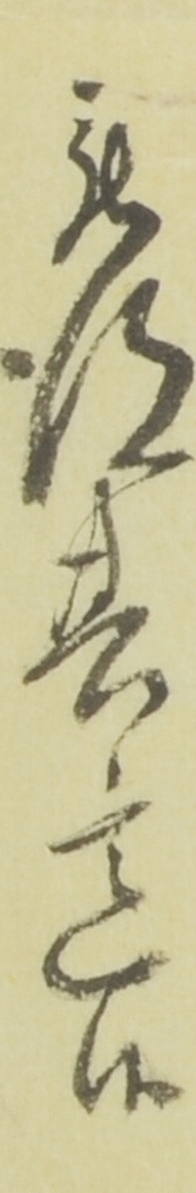被得其意候
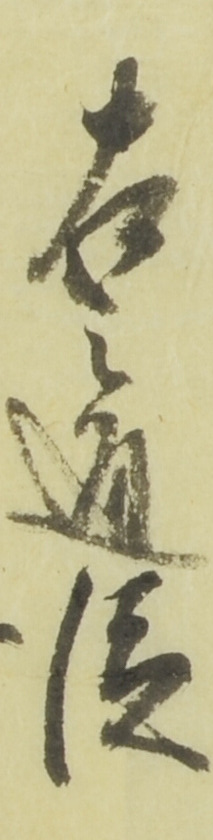右之通従
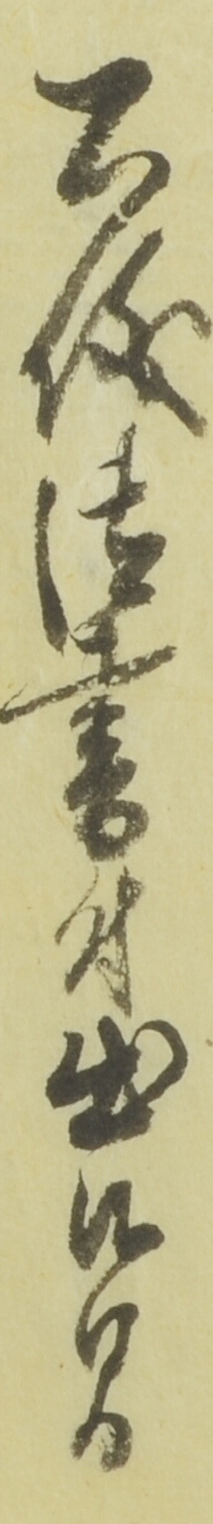公儀御書付出候間
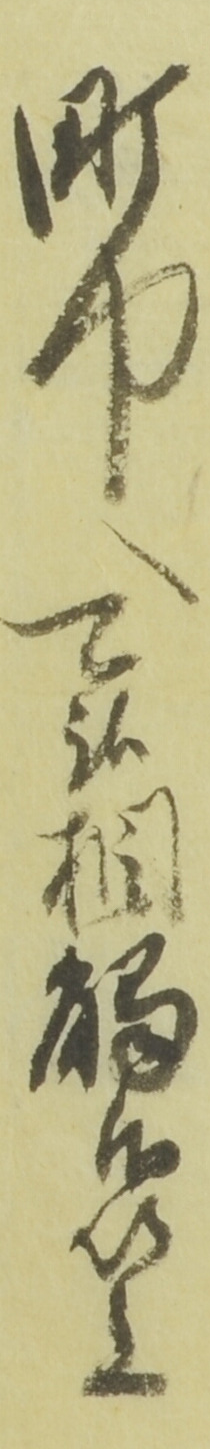町中へ可被相触候以上
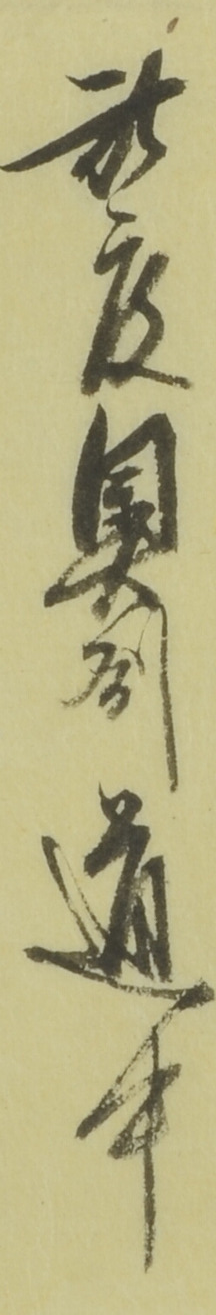此度奥州道中
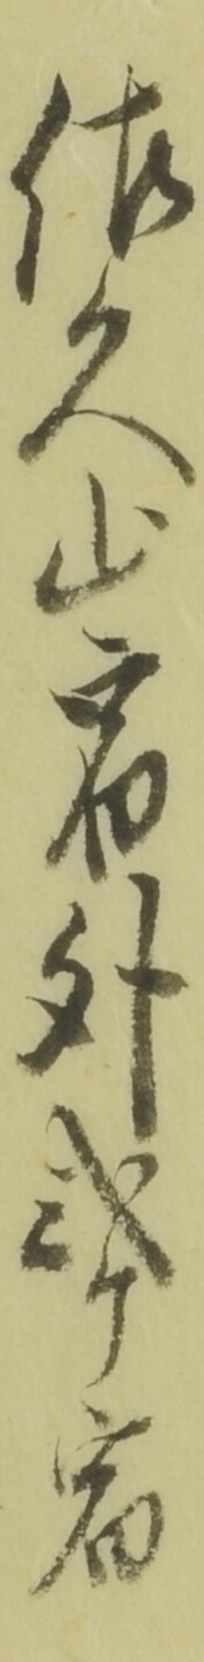佐久山宿外弐ヶ宿
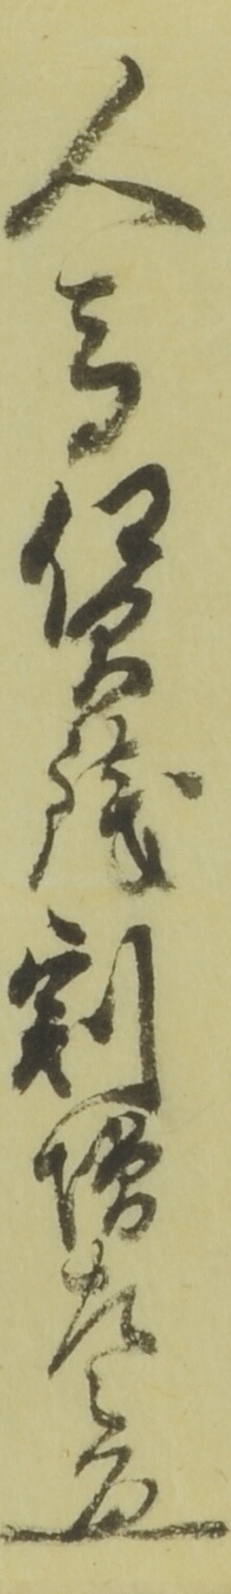人馬賃銭割増左之通
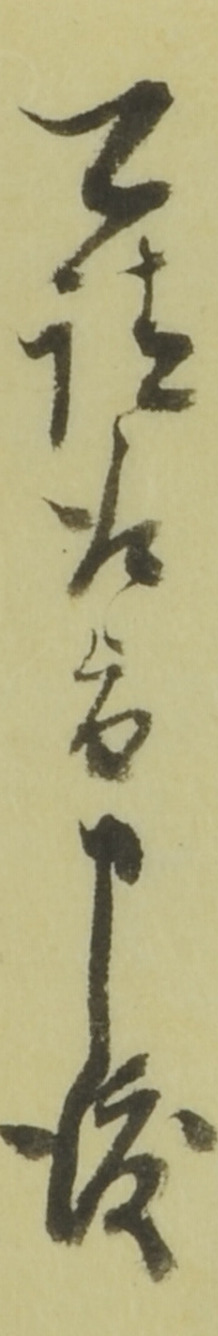可請取旨申渡
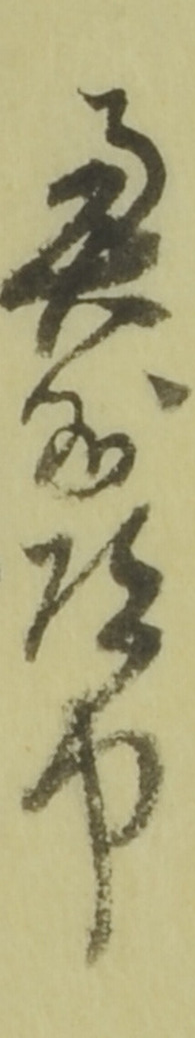奥州道中
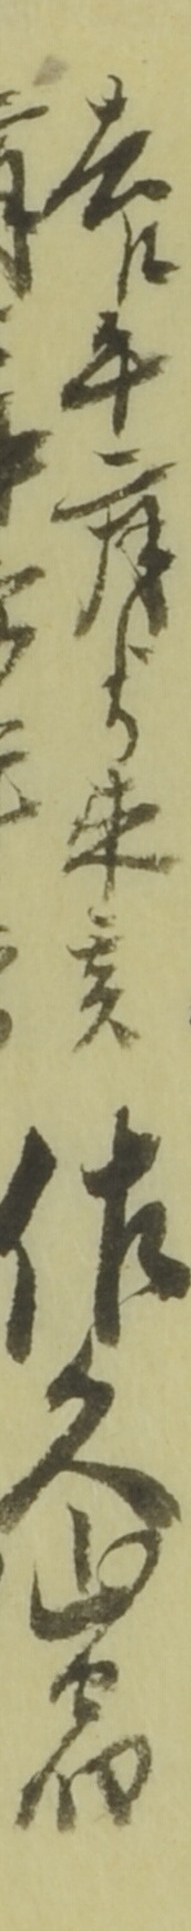去ル午二月より来亥佐久山宿
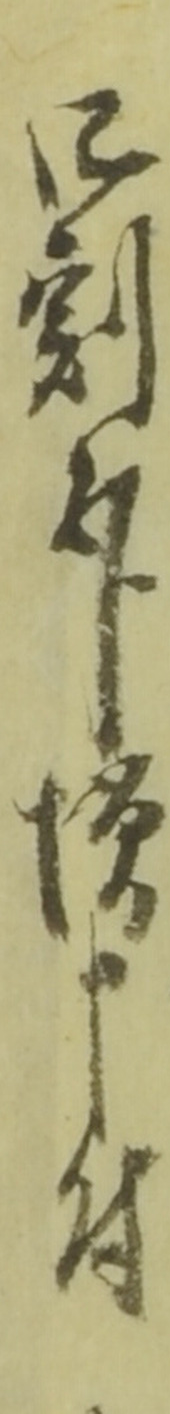四割五分増申付

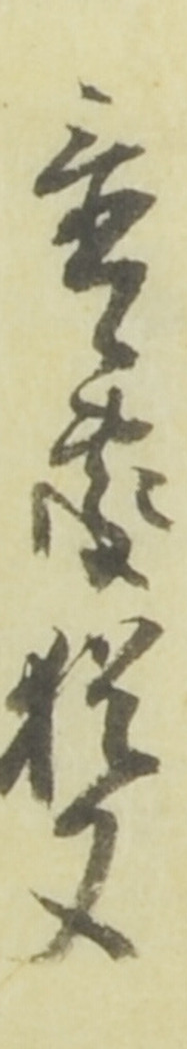置候処猶又
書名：御触書御書附控
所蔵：伊那市立高遠町図書館・合同会社AMANE
